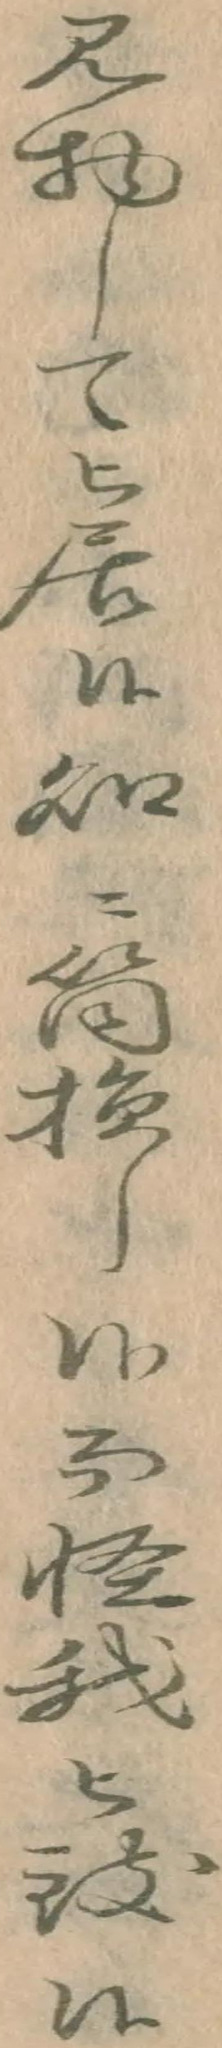見物して被居候処に筒損し候而怪我被致候
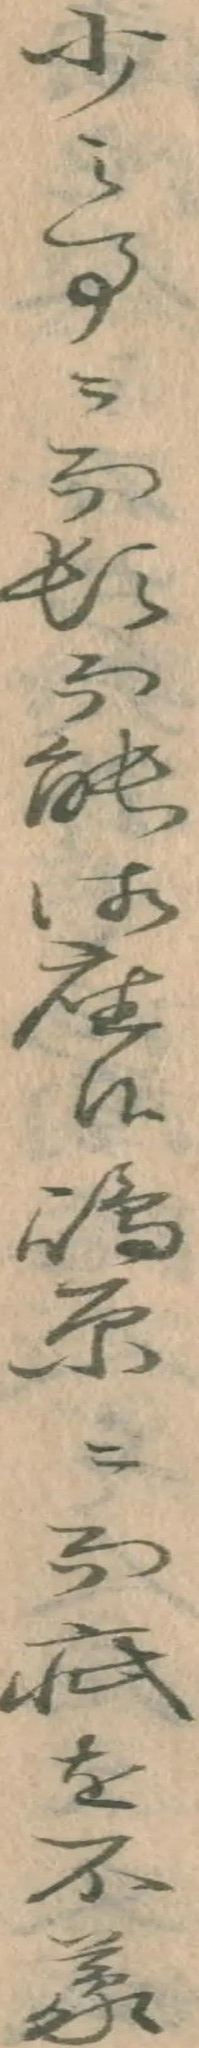少之事に而頓而能御座候島原に而疵を不蒙
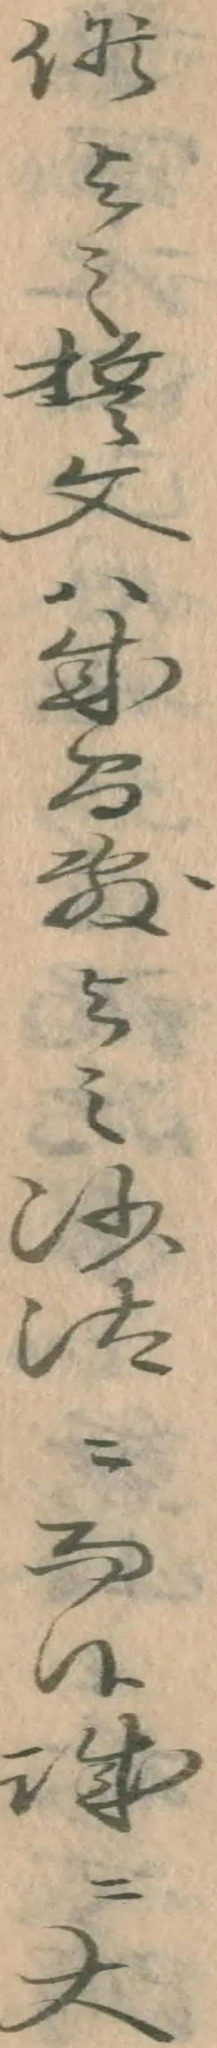候与之誓文は成間敷与之沙汰に而候誠に大
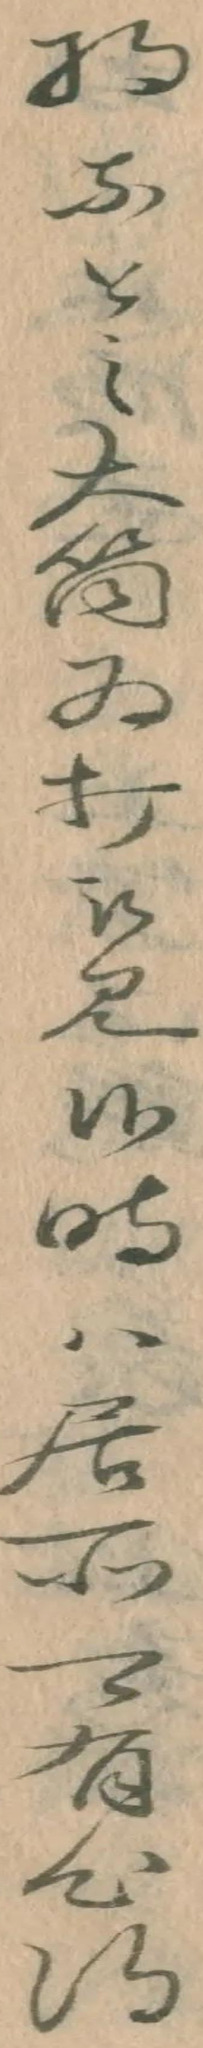将なと之大筒ゐ打被見候時は居所可有心得
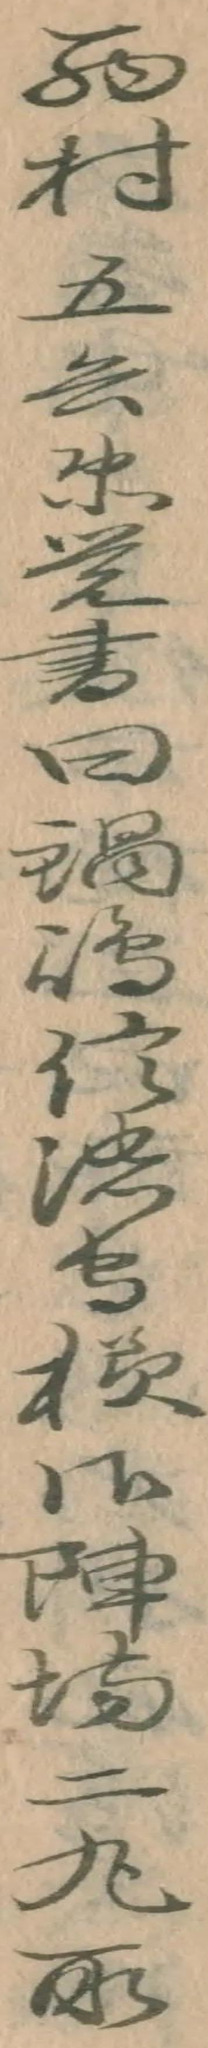西村五兵衛覚書曰鍋島信濃守様御陣場二丸取
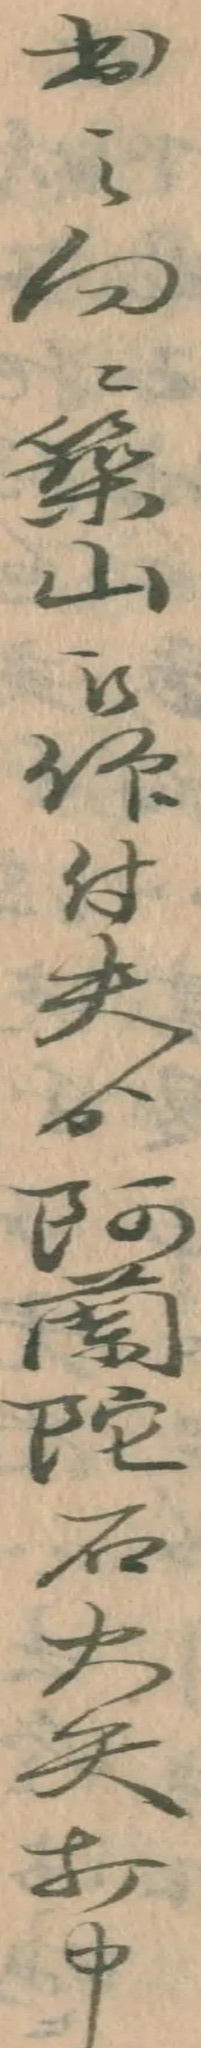出之向に築山被仰付夫ゟ阿蘭陀石火矢打申
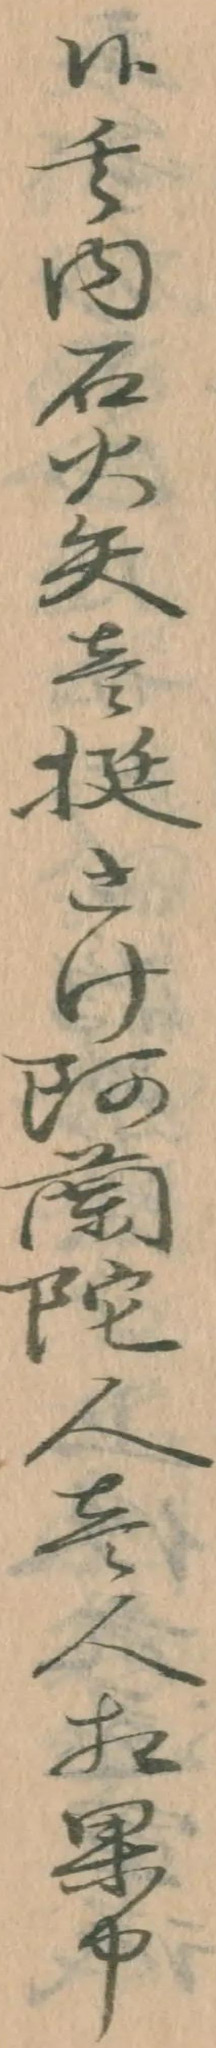候其内石火矢壱挺さけ阿蘭陀人壱人相果申
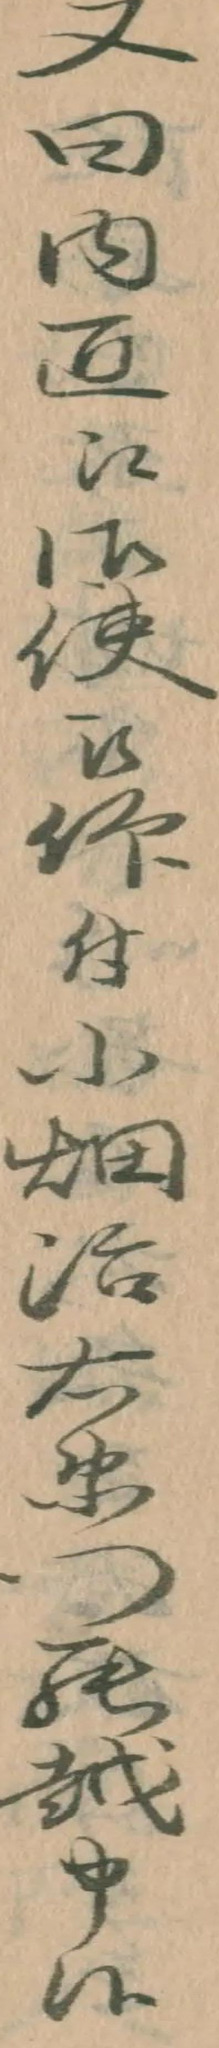又曰内匠江御使被仰付小畑治右衛門罷越申候
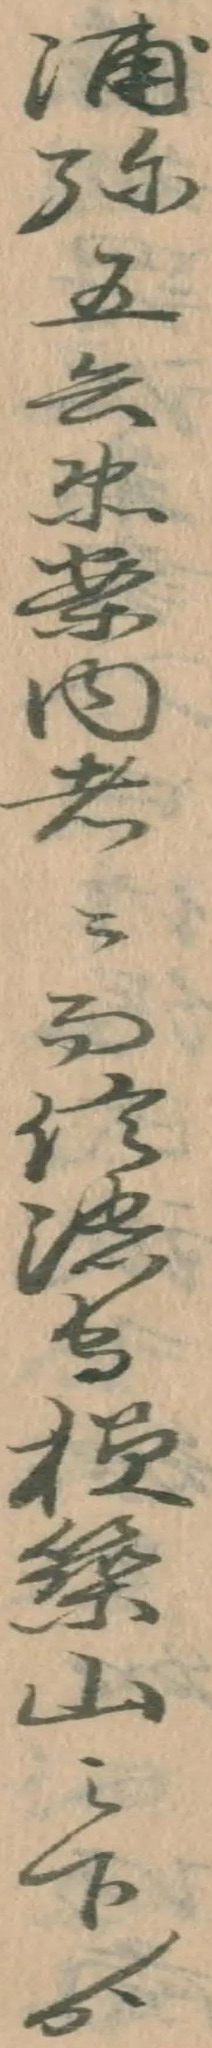浦弥五兵衛案内者に而信濃守様築山之下ゟ
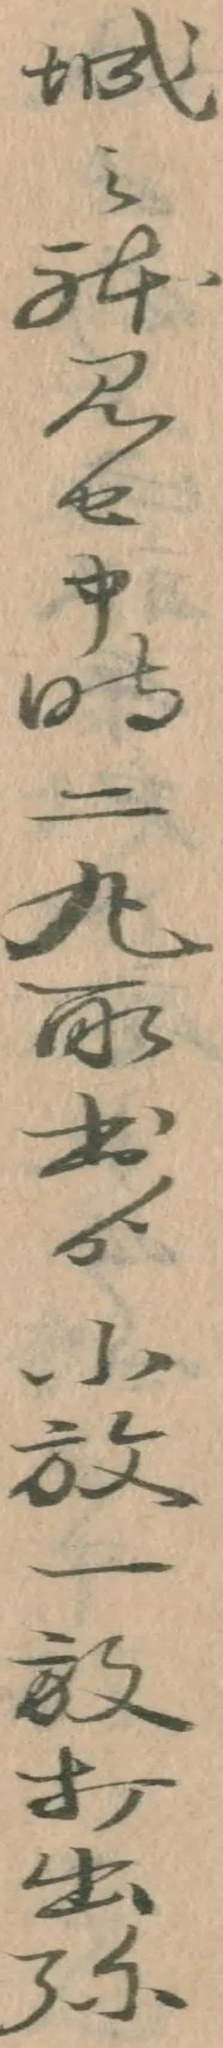城之躰見せ申時二丸取出ゟ小放一放打出弥
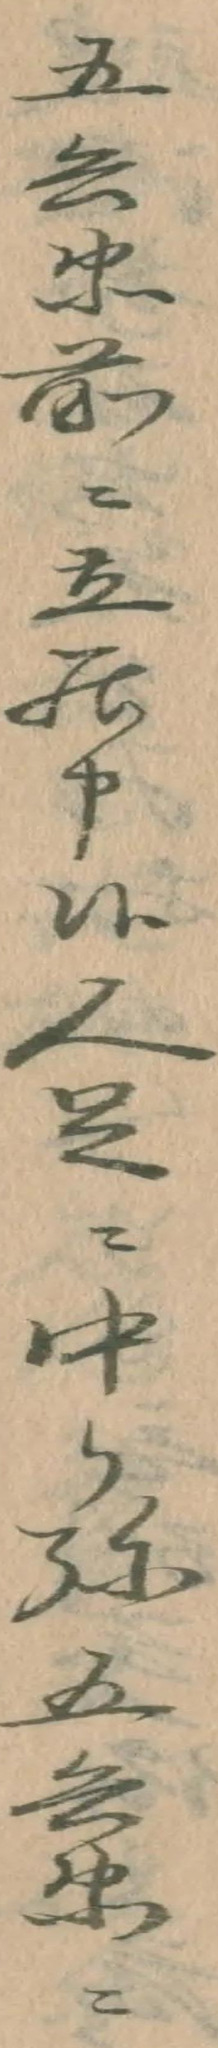五兵衛前に立居申候人足に中り弥五兵衛に
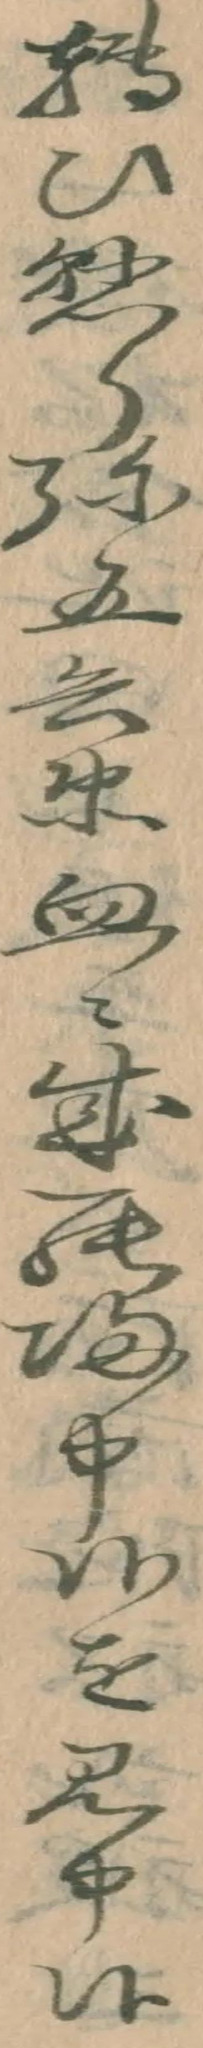転ひ懸り弥五兵衛血に成罷帰申候を見申候
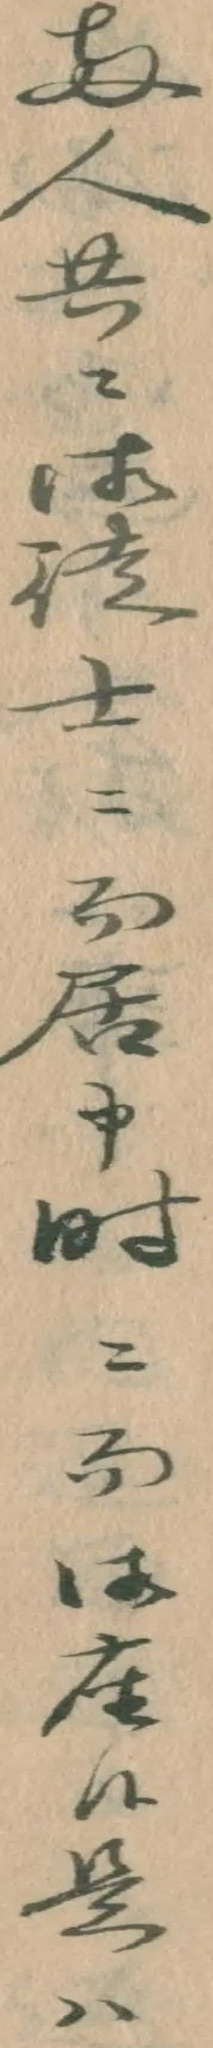両人共に御徒士に而居申時に而御座候是は
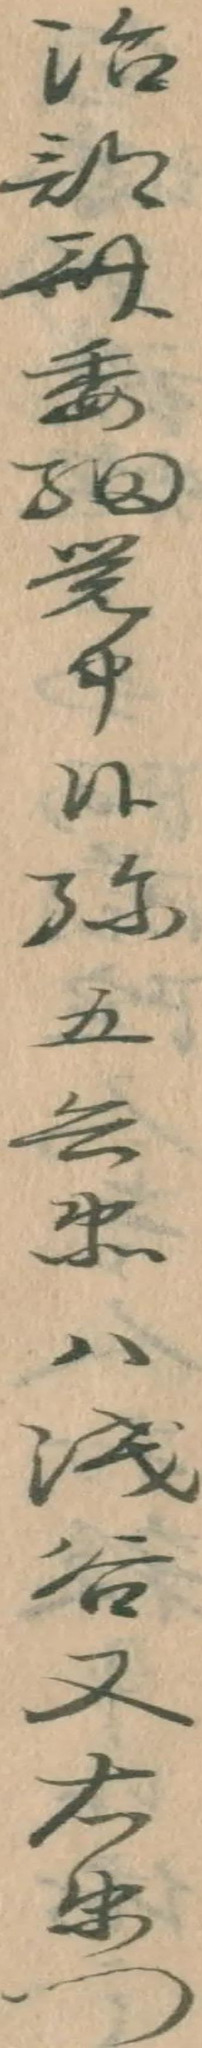治部斎委細覚申候弥五兵衛は浅谷又右衛門
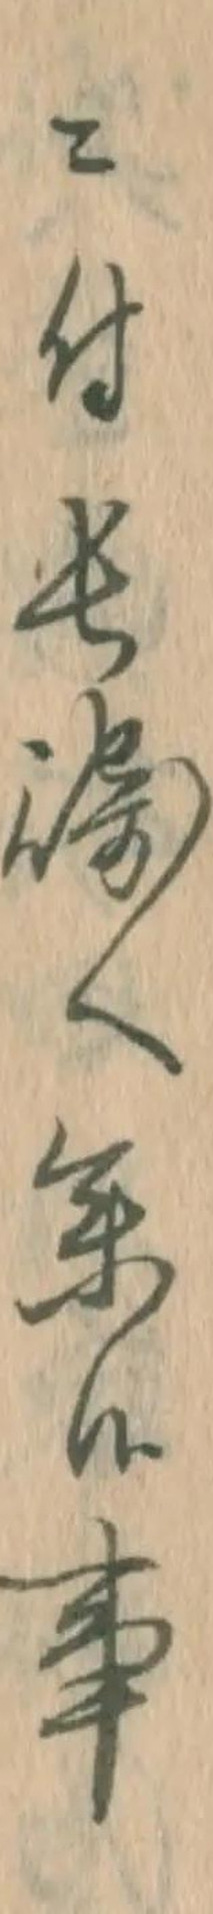に付長崎へ参候事
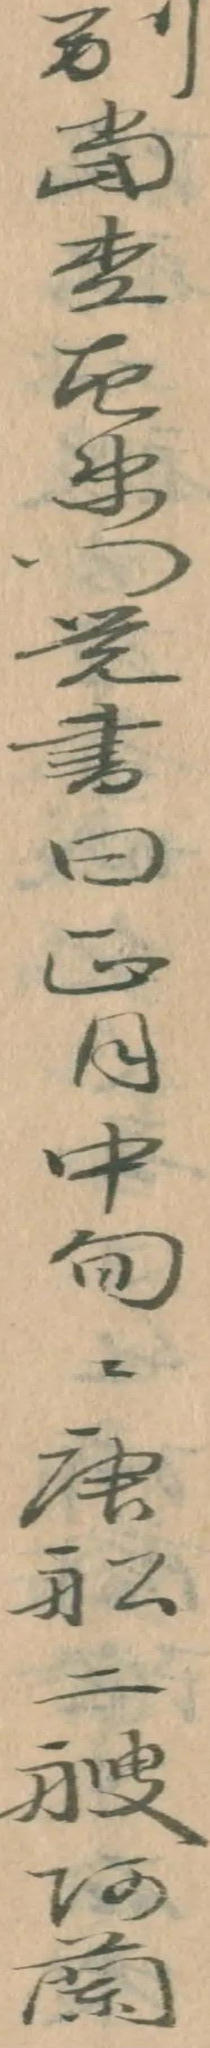別当杢左衛門覚書曰正月中旬に唐舩二艘阿蘭
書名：切支丹御退治記 49巻. [6]
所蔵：国立国会図書館 National Diet Library, JAPAN
